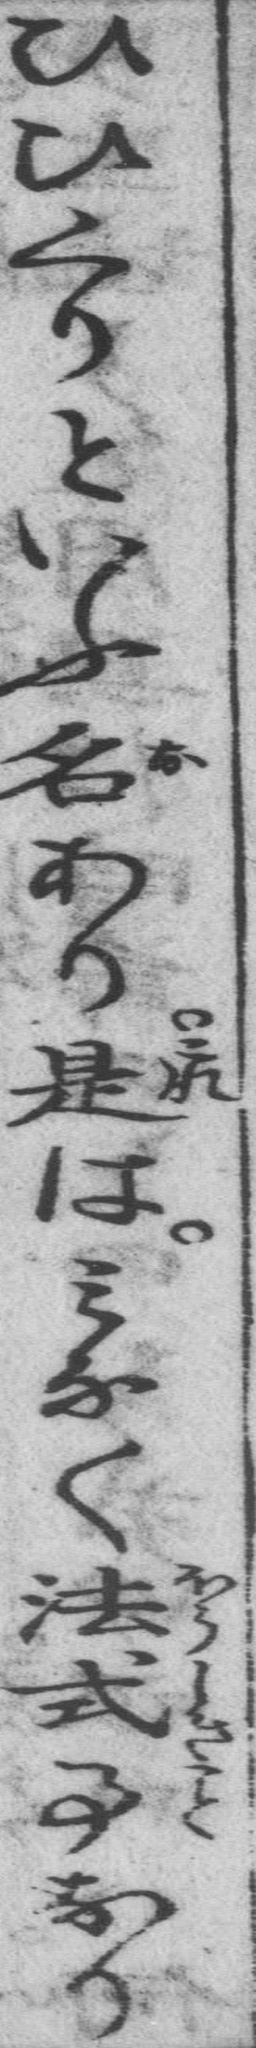ひひくりといふ名あり。是は。みな〳〵法式事なり
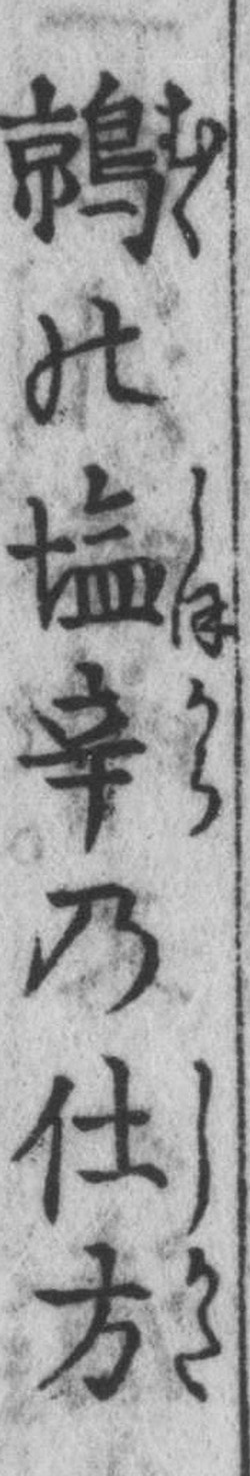鶁の塩辛の仕方
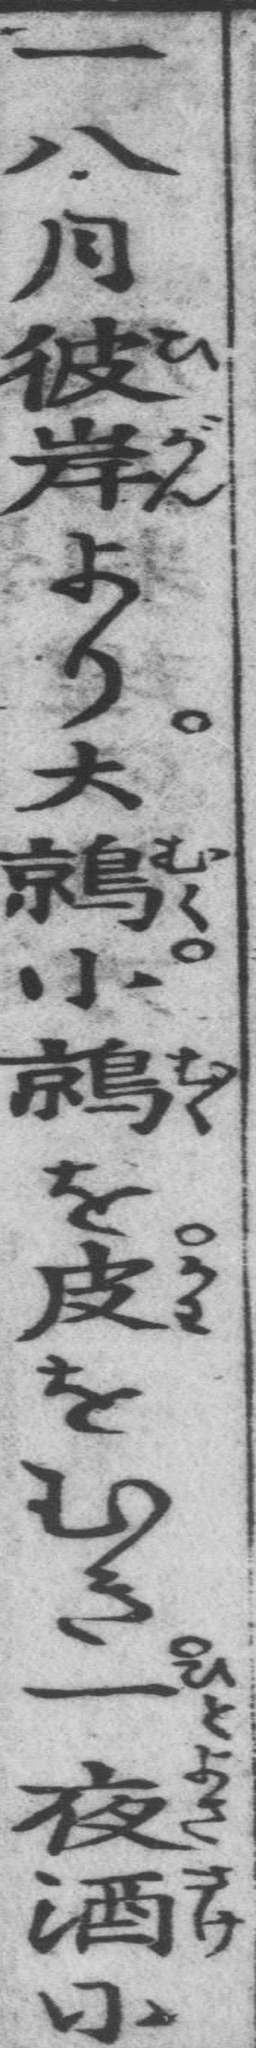一八月彼岸より。大鶁。小鶁を。皮をむき。一夜酒に
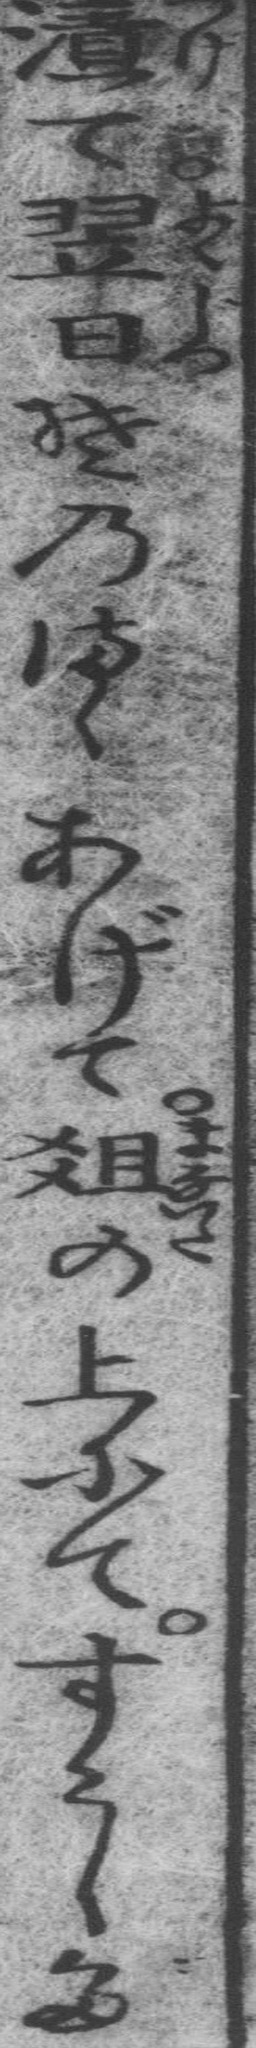漬て。翌日そのまゝあげて。俎の上にて。すこした
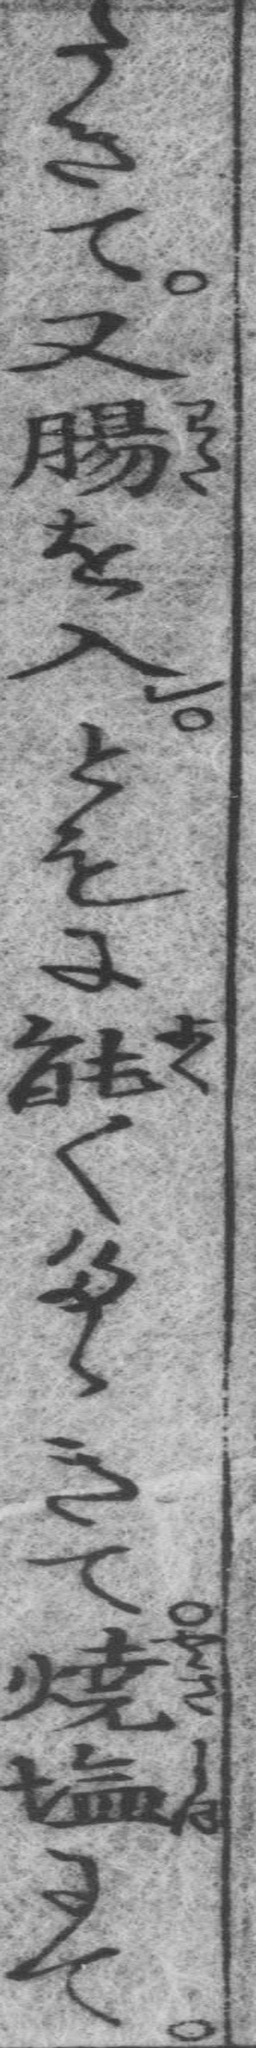たきて。又腸を入れ。ともに能〳〵たゝきて。焼塩にて。
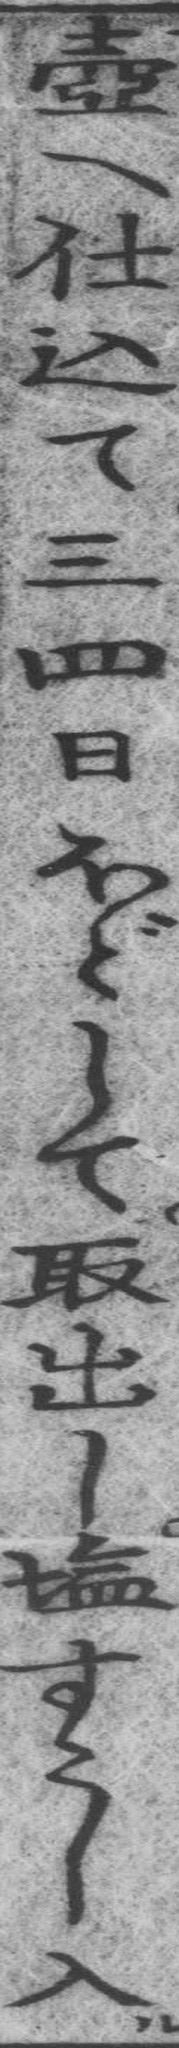壺へ仕込て。三四日ほどして。取出し。塩すこし入る
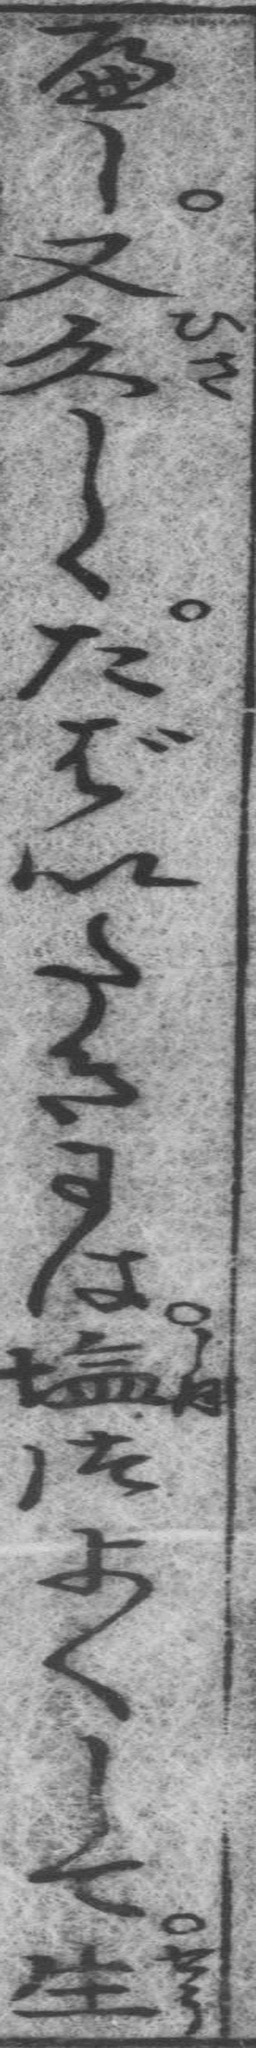へし。又久しく。たばいたきには。塩つよくして。生
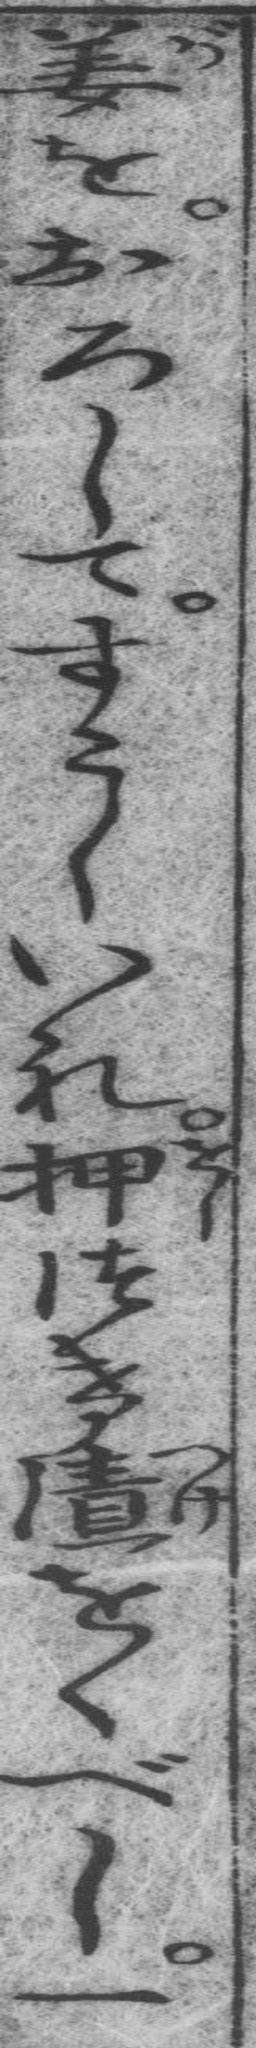姜を。おろして。すこしいれ。押つけ漬をくべし。一
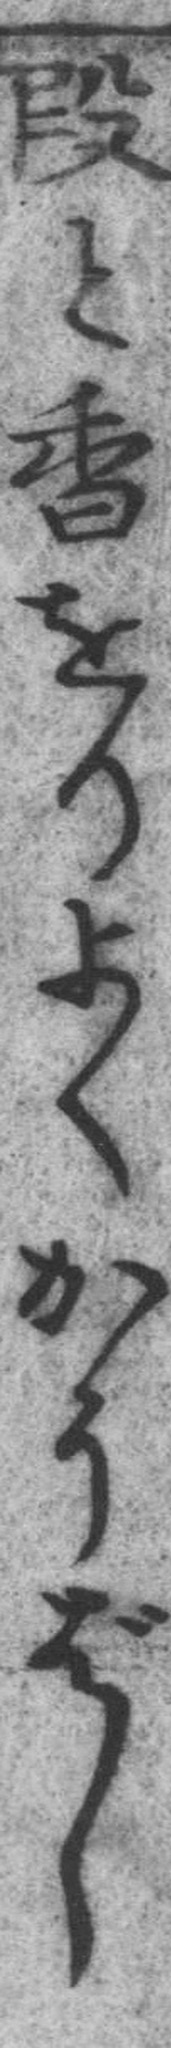段と。香をりよく。かうばし

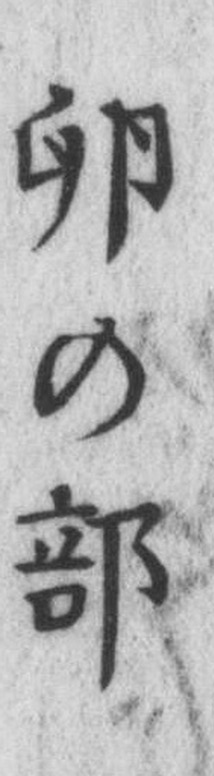卵の部
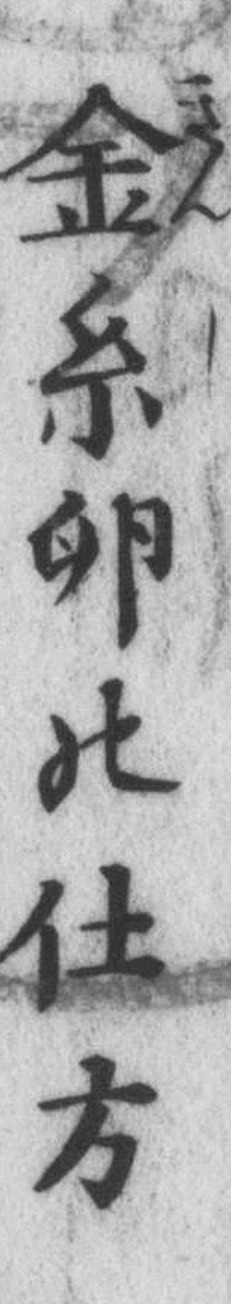金糸卵の仕方
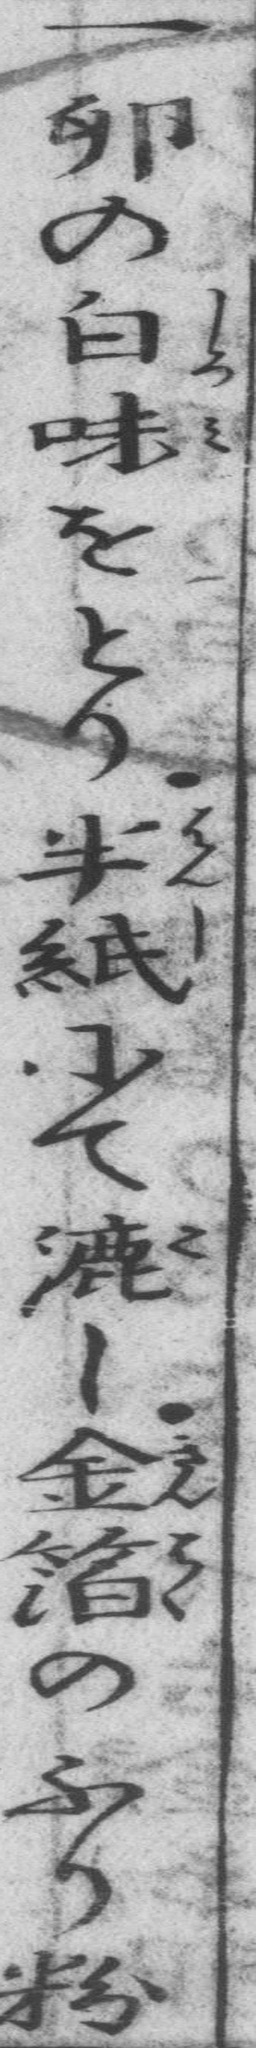一卵の白味をとり。半紙にて漉し。金箔のふり粉
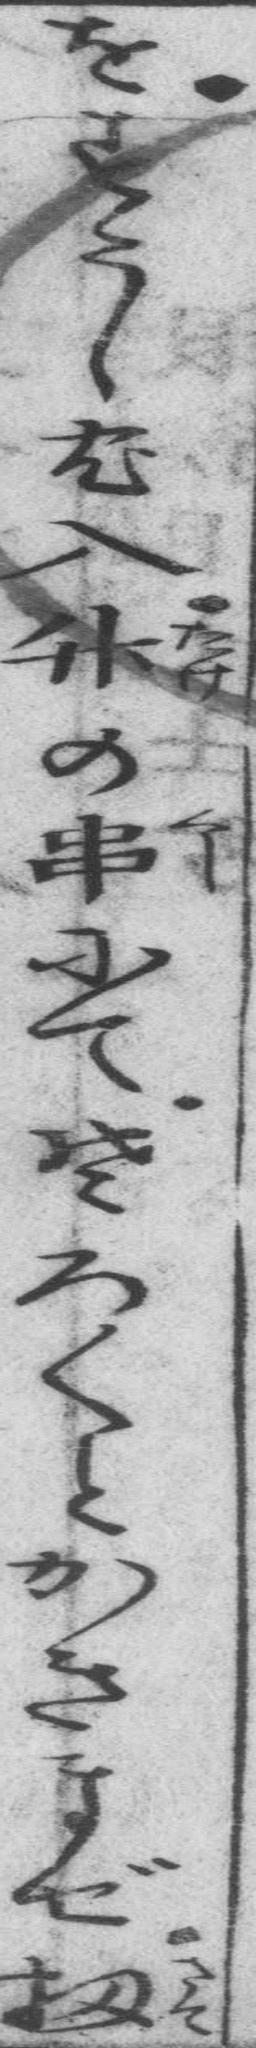を。すこし充入れ。竹の串にて。そろ〳〵とかきまぜ。扨
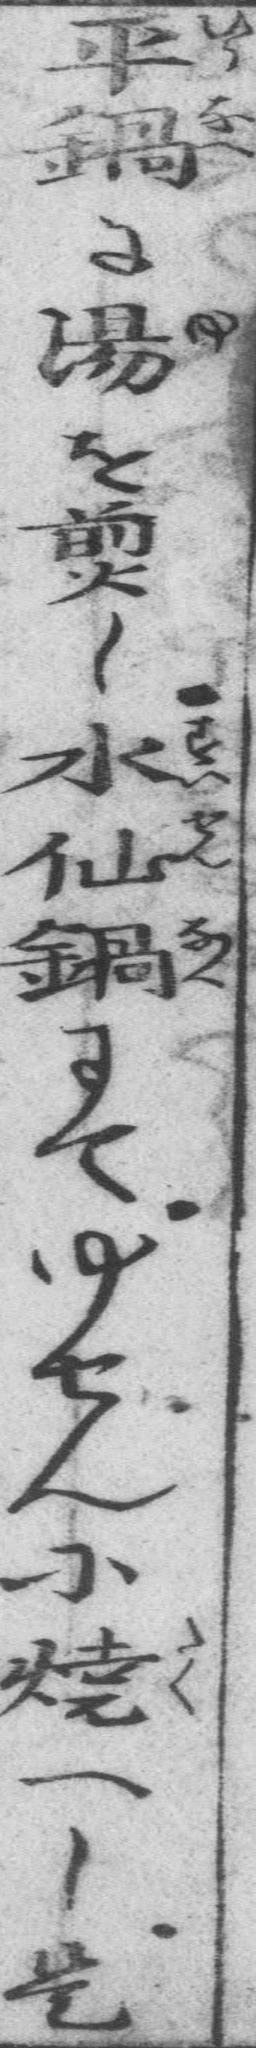平鍋に湯を煎し。水仙鍋にて。ゆせんに焼へし。是
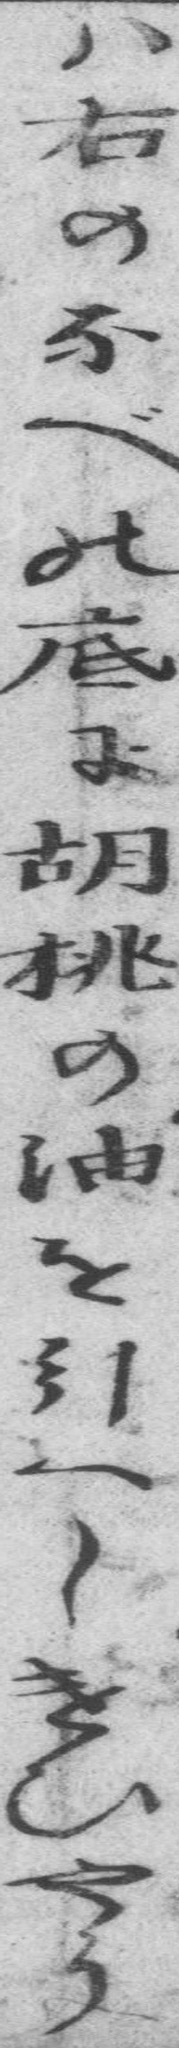は。右のなべの底に。胡桃の油を引へし。遣ひやう

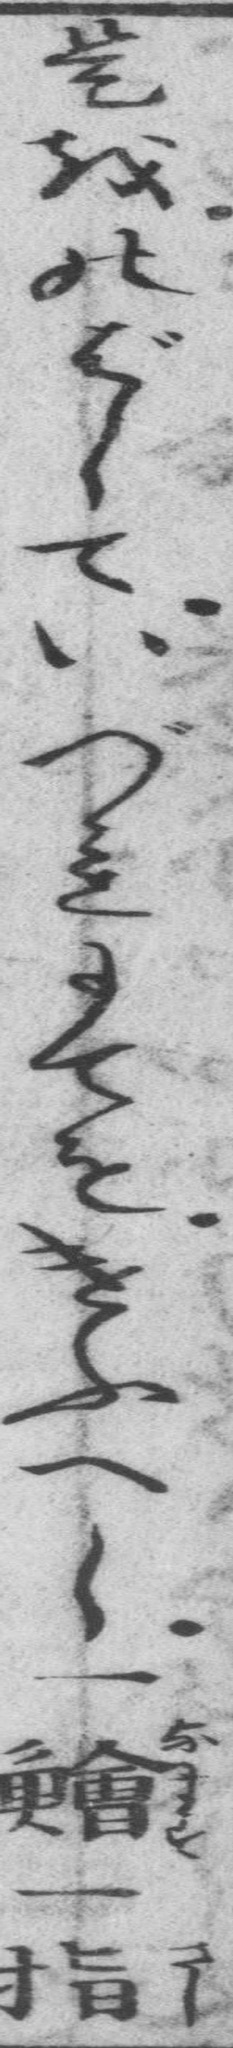是を。のばして。いづれにても。遣ふへし。一鱠一指
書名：萬寳料理秘密箱
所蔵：大阪府立大学学術情報センター 国文学研究資料館
